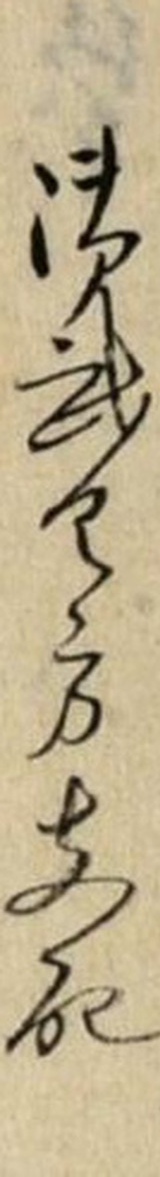御武具方支配
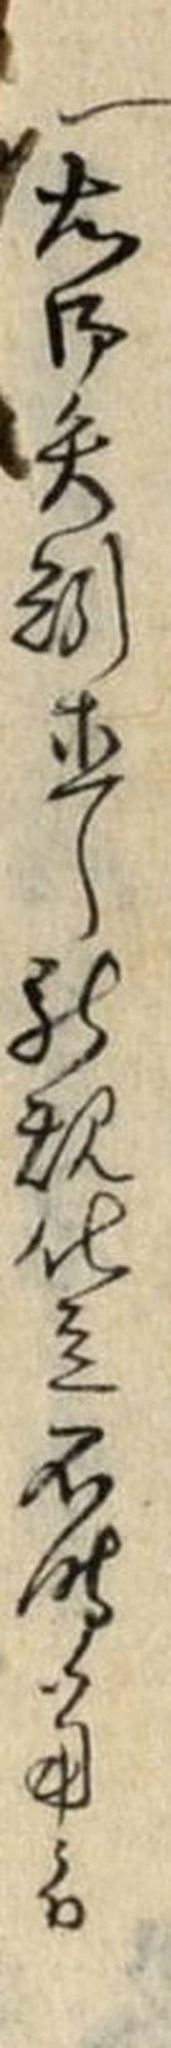右矢矧直し新規仕立不時御用に付
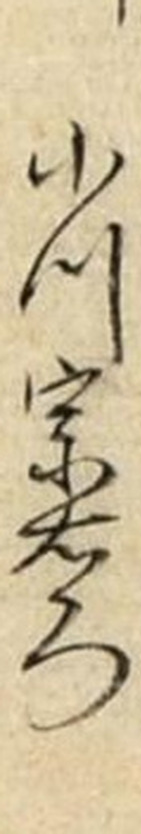同小川宗右衛門
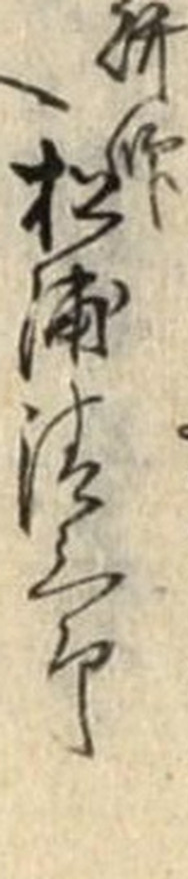松浦源十郎
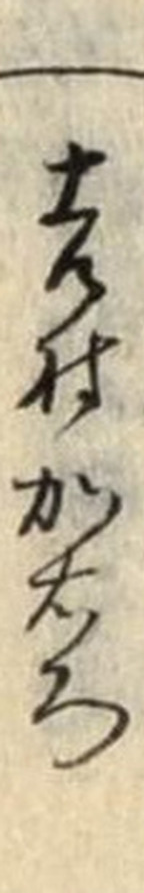吉村加右衛門
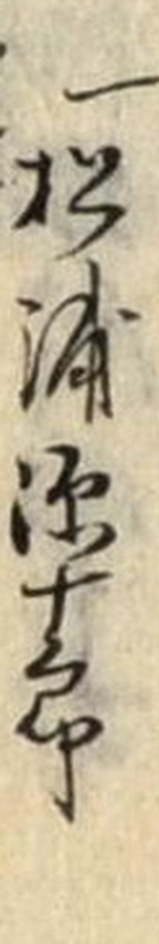松浦源十郎
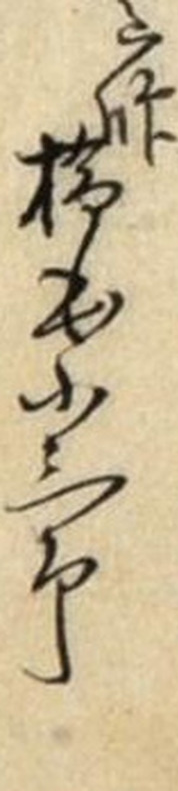台師橋本小三郎

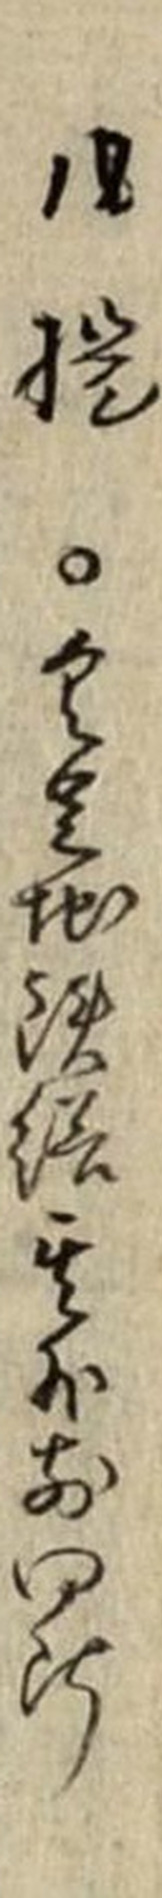風提○具足地鉄繕其外前同断御楯師
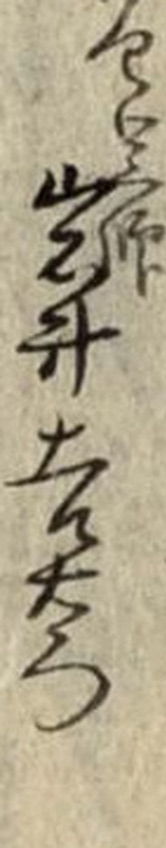岩井吉右衛門
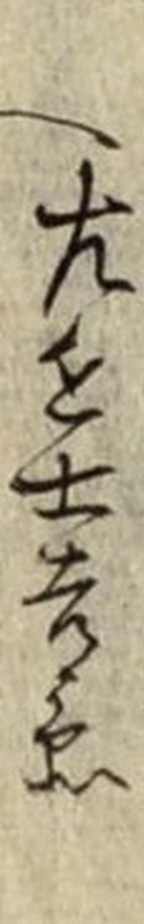左近士吉兵衛
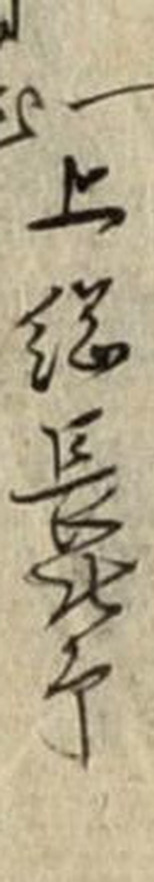上総長次郎
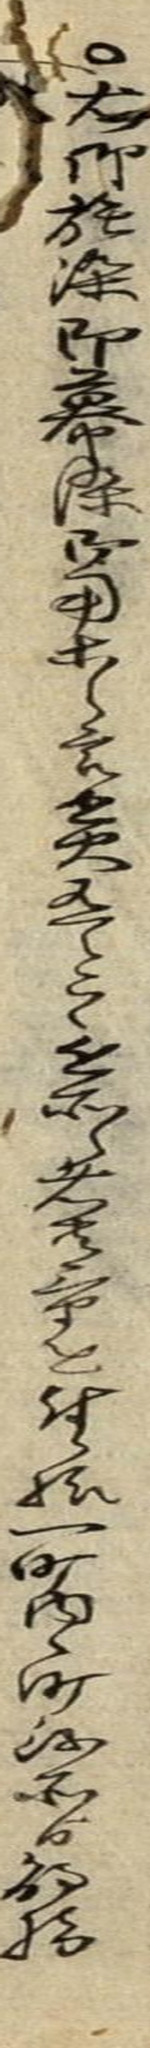○右御旗染御幕染御用等之節出火有之候はゝ近所之者共気を付候様一町内之町役所ゟ触指
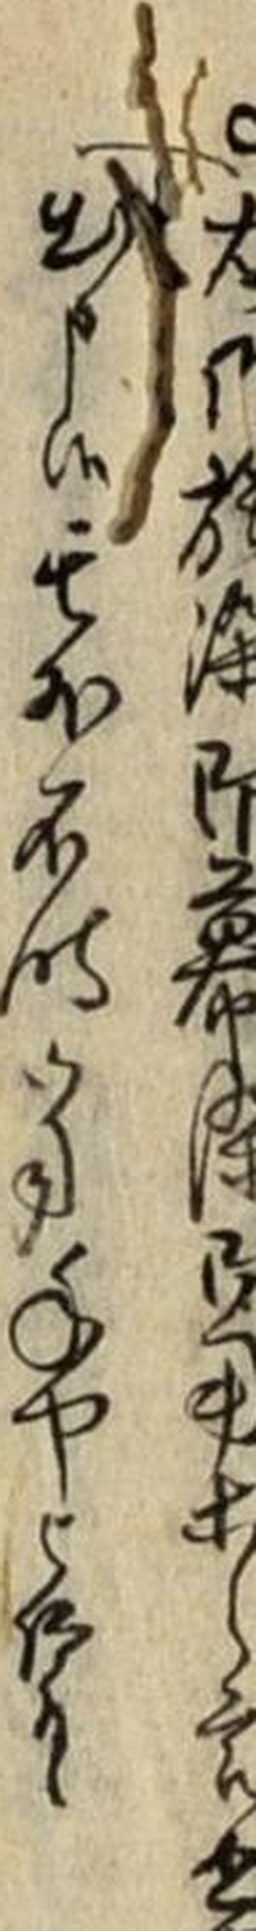出申候其外不時御用年中被仰付候
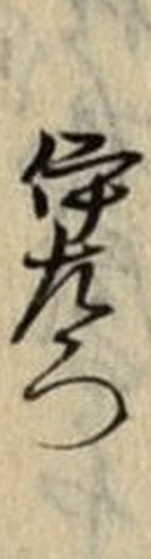伊左衛門
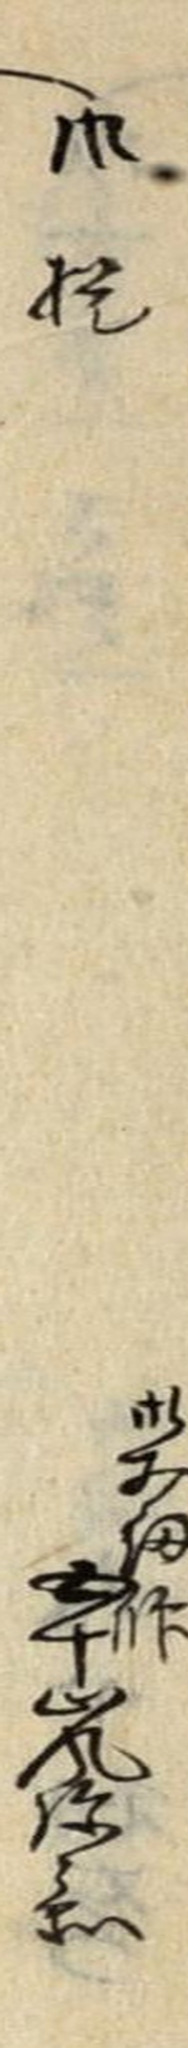五十嵐源兵衛
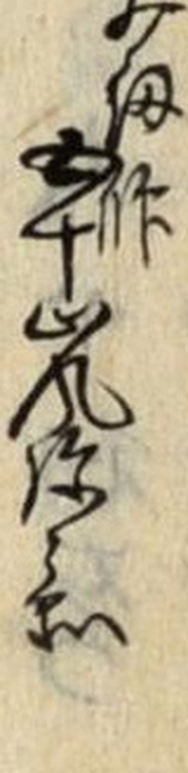五十嵐源兵衛
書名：蒐輯之部
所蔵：福井県文書館 Fukui Prefectural Archives
